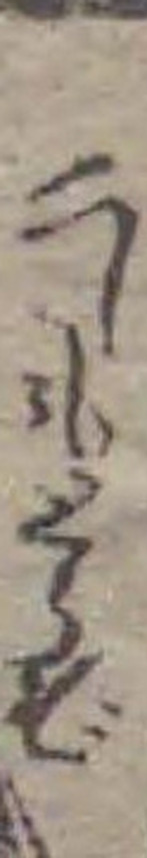くしもとうぞ
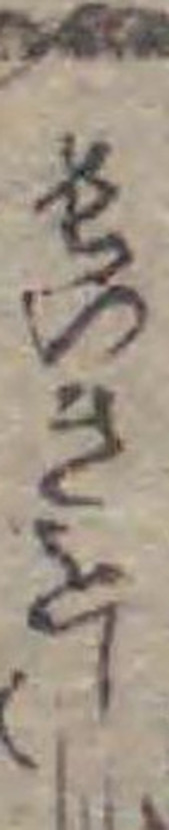長いきをし
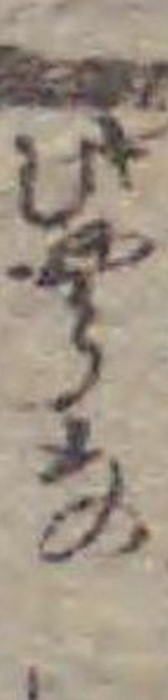此やうな
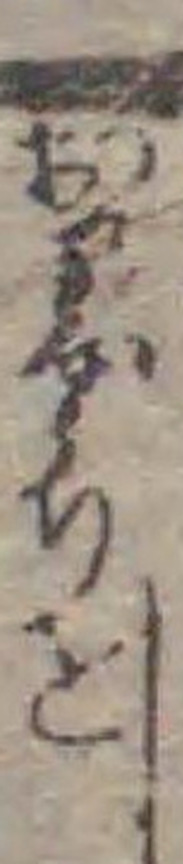おりやうりを
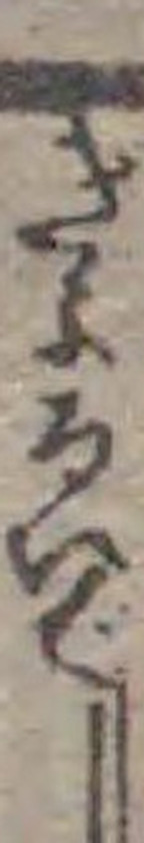ぎよるいで
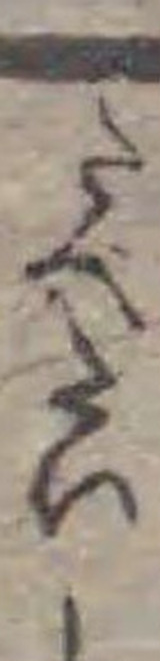たべたい
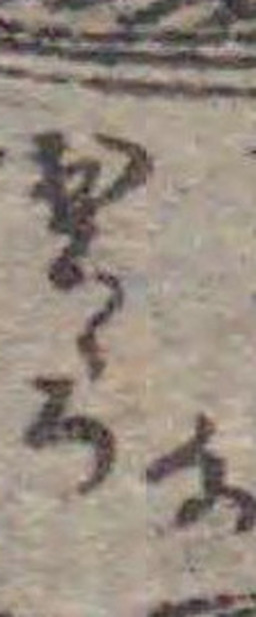おこゝろ
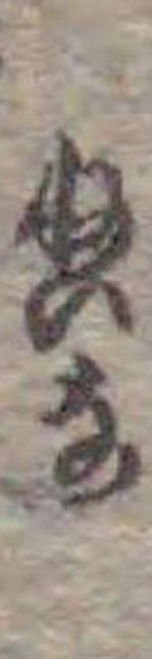ねいな
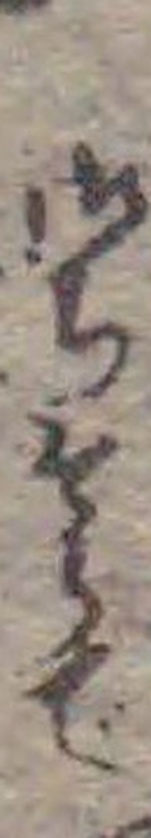御ちそうで
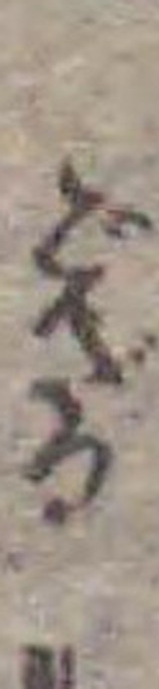ござる

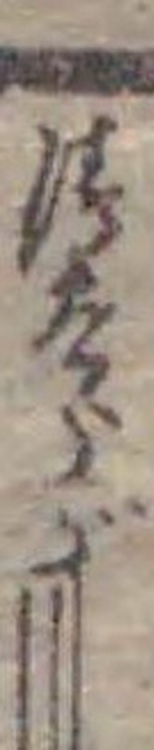清太郎が
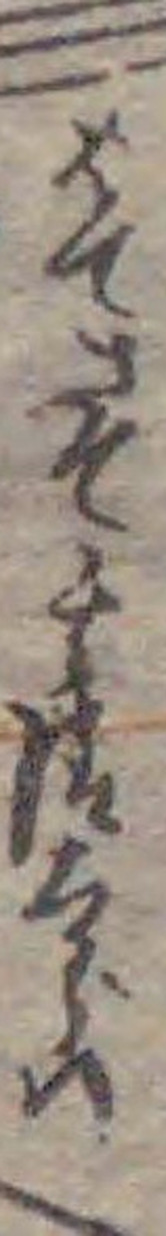はてさて其清太郎は
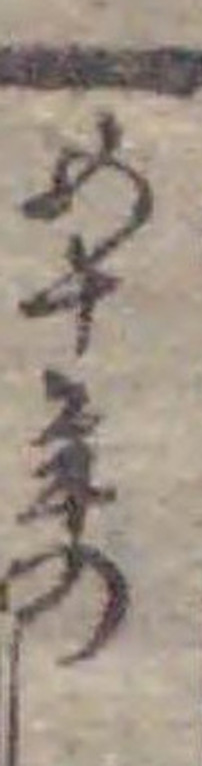五十年の
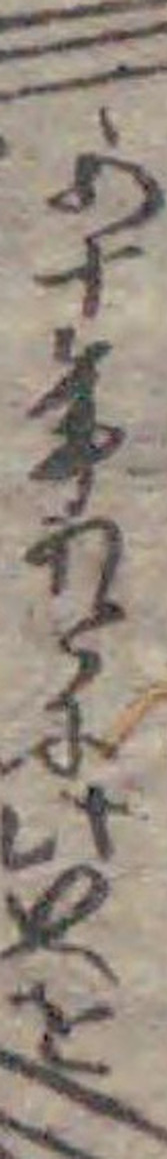五十年あとに此いへを
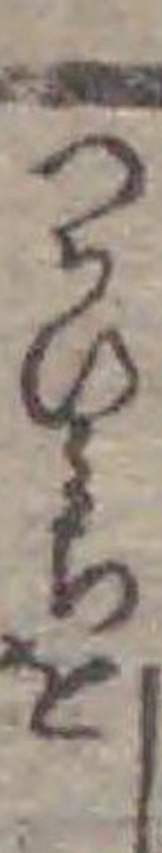つかいみちを
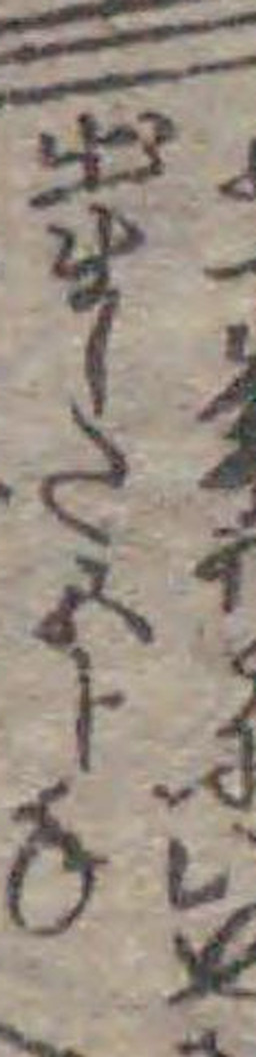出ました五十年
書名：見徳一炊夢 : 3巻
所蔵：国立国会図書館 National Diet Library, JAPAN
